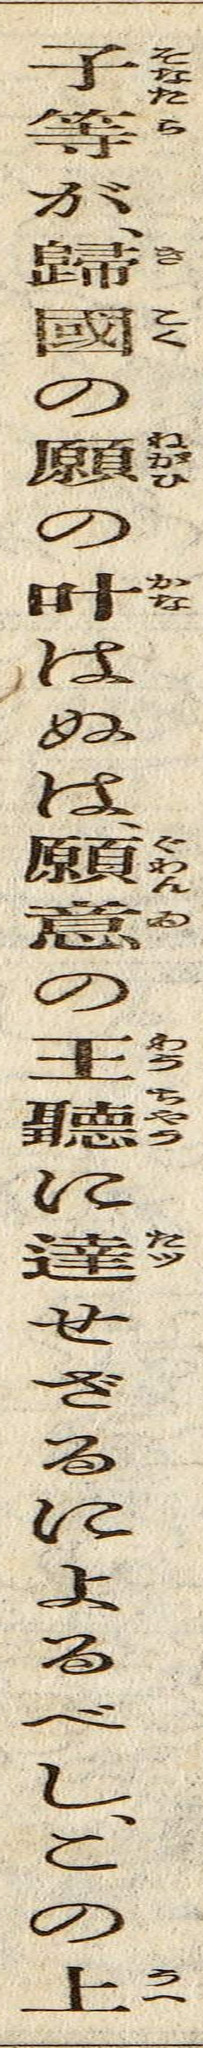子等が、帰国の願の叶はぬは、願意の王聴に達せざるによるべし、この上
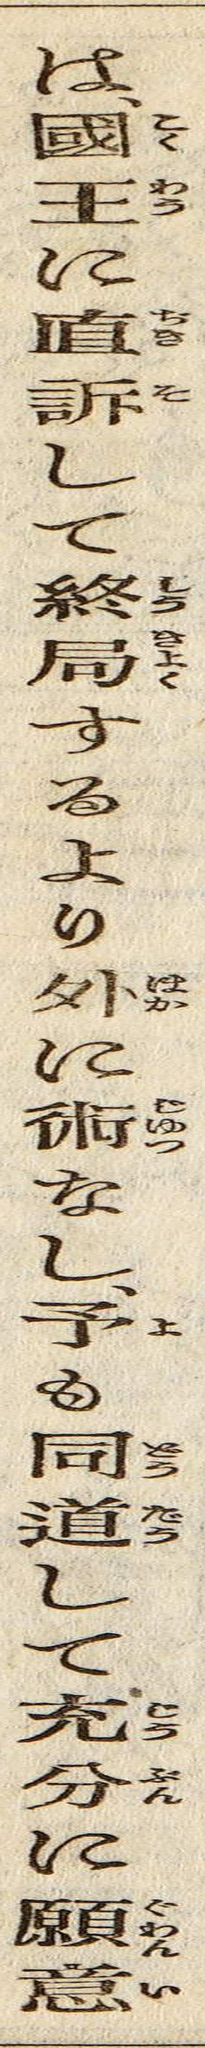は、国王に直訴して終局するより外に術なし、予も同道して充分に願意
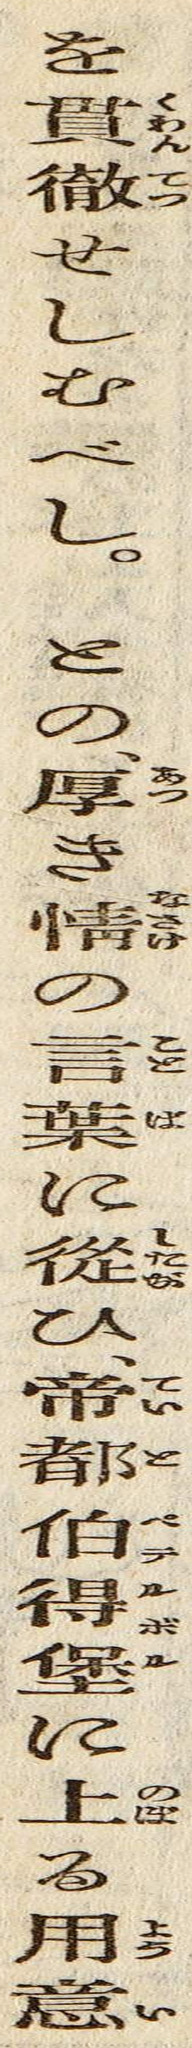を貫徹せしむべし。との厚き情の言葉に従ひ、帝都伯得堡に上る用意
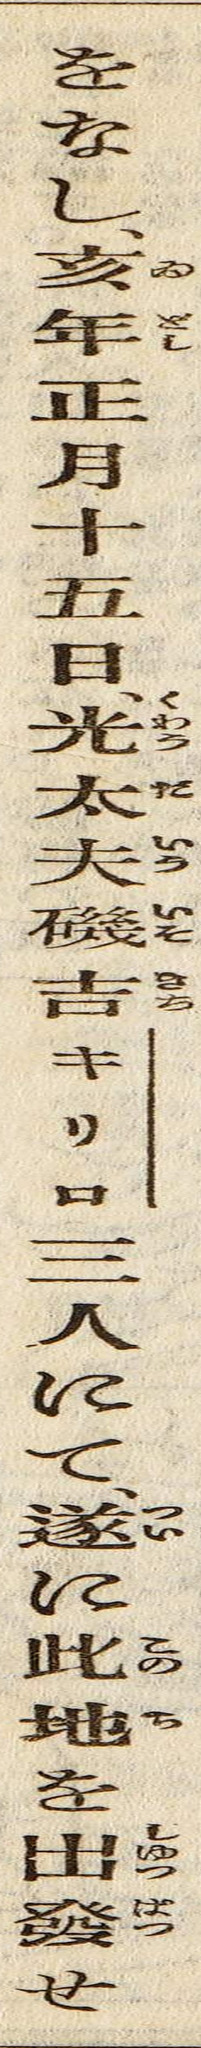をなし、亥年正月十五日、光太夫磯吉キリロ三人にて、遂に此地を出発せ
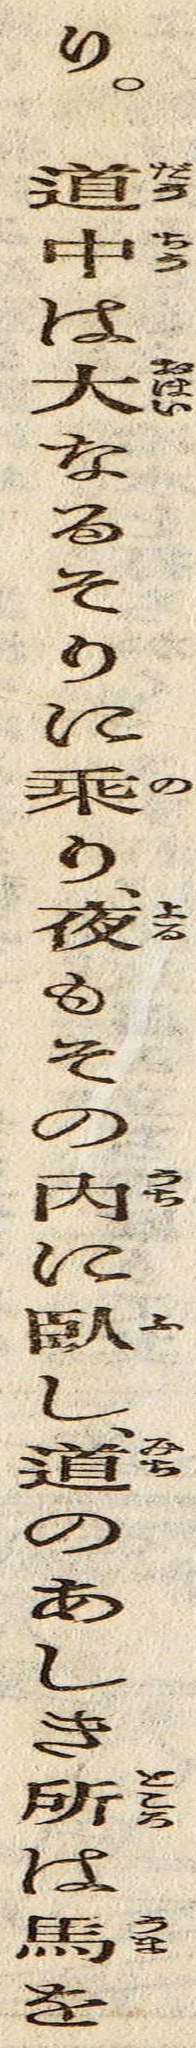り。道中は大なるそりに乗り、夜もその内に臥し、道のあしき所は馬を
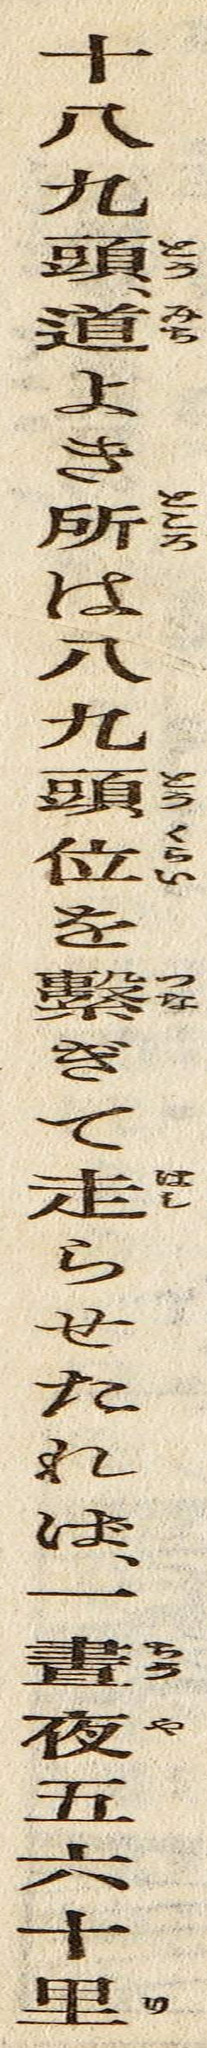十八九頭、道よき所は八九頭位を繋ぎて走らせたれば、一昼夜五六十里
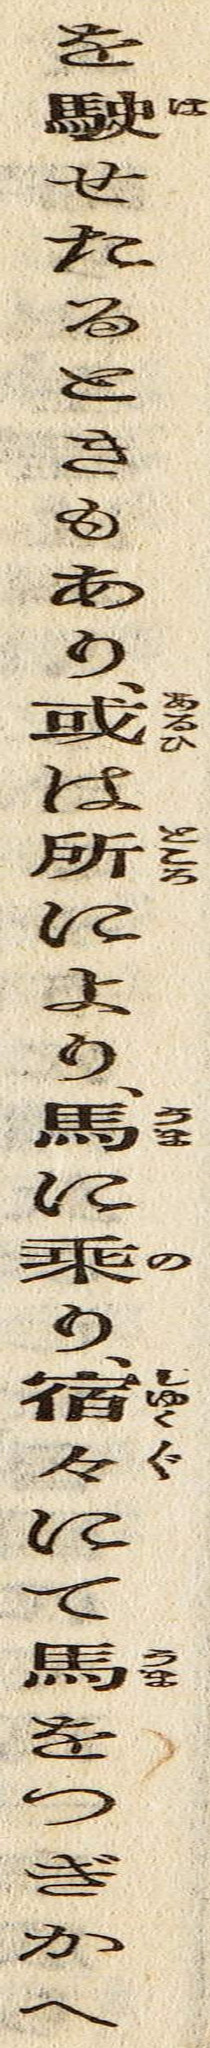を駛せたるときもあり、或は所により馬に乗り、宿々にて馬をつぎかへ
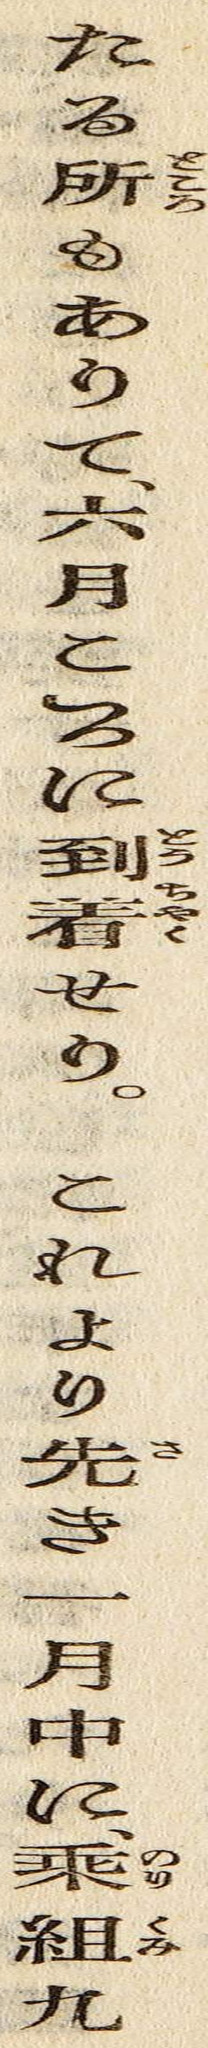たる所もありて、六月ころに到着せり。これより先き一月中に、乗組九
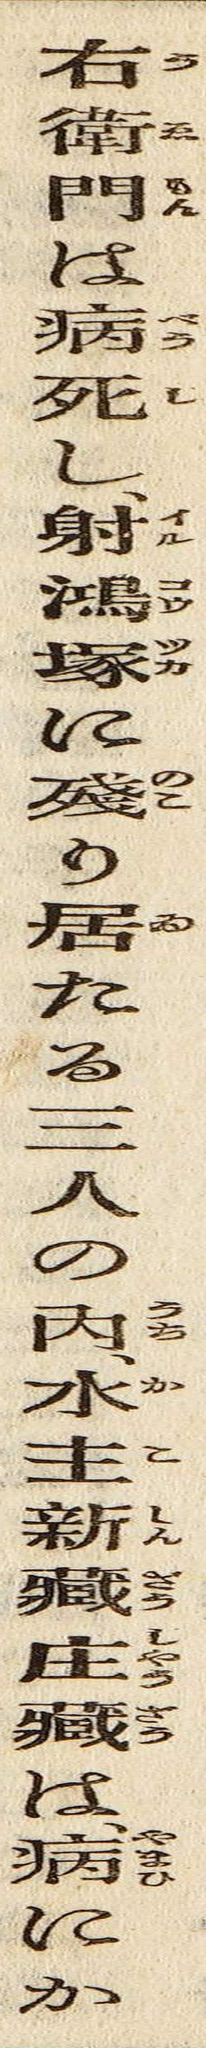右衛門は病死し、射鴻塚に残り居たる三人の内、水主新蔵庄蔵は、病にか
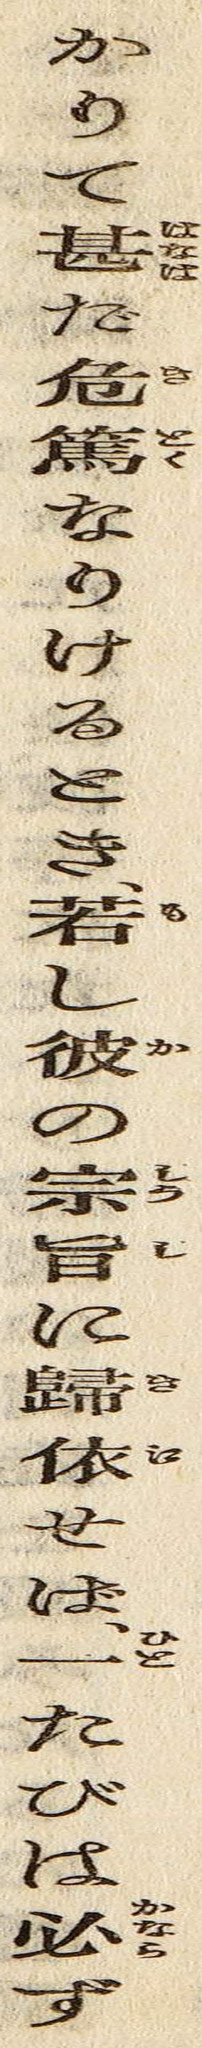かりて甚だ危篤なりけるとき、若し彼の宗旨に帰依せば、一たびは必ず
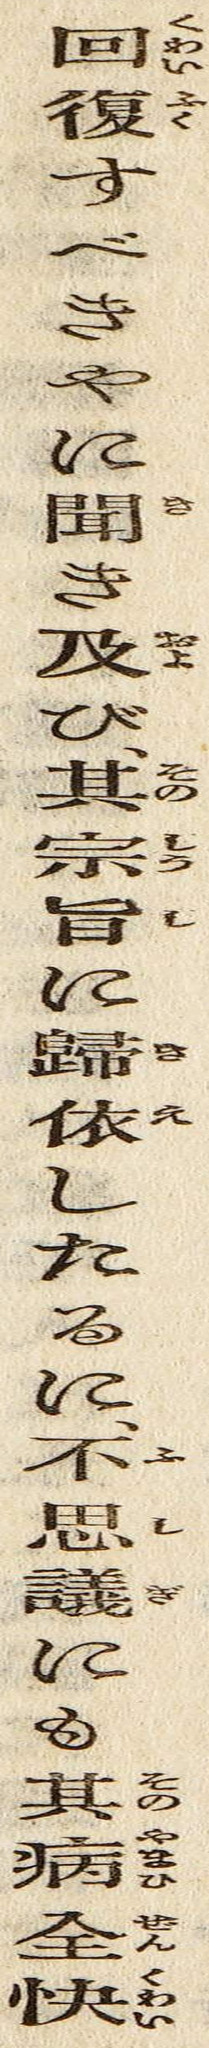回復すべきやに聞き及び、其宗旨に帰依したるに、不思議にも其病全快
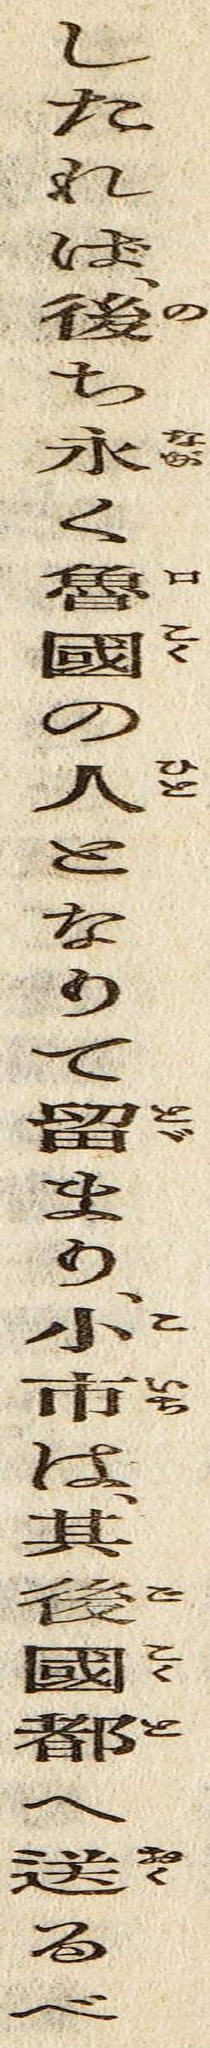したれば、後ち永く魯国の人となりて留まり、小市は、其後国都へ送るべ
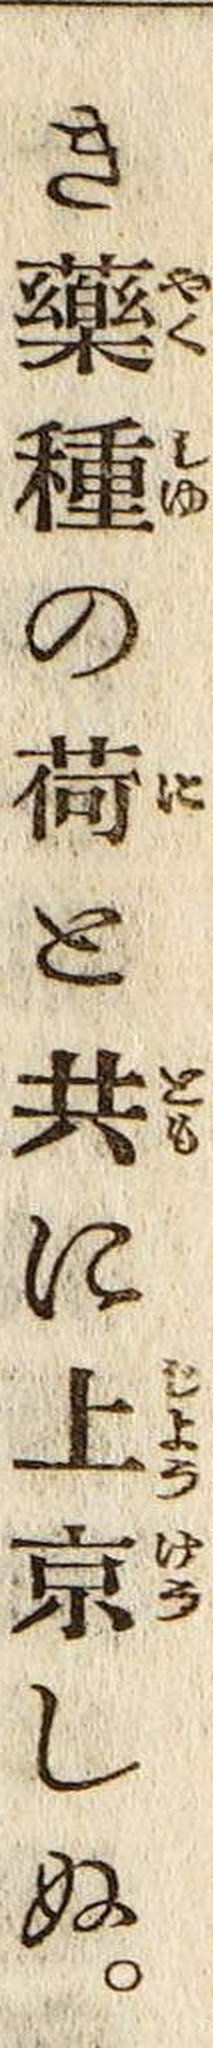き薬種の荷と共に上京しぬ。
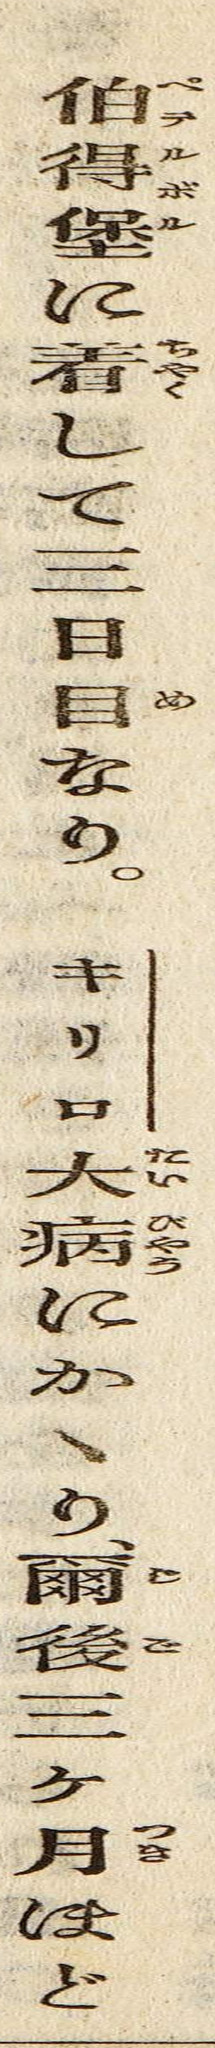伯得堡に着して三日目なり。キリロ大病のかゝり、爾後三ヶ月ほど
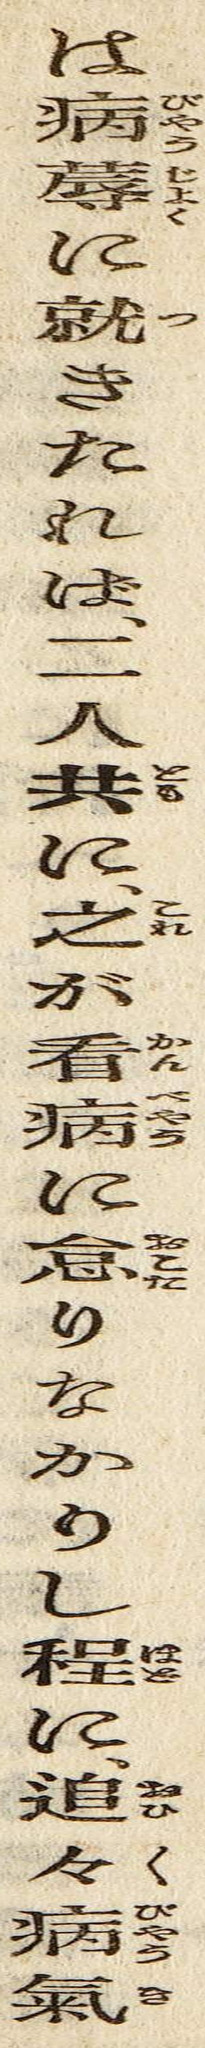は病蓐に就きたれば、二人共に、之が看病に怠りなかりしほどに、追々病気
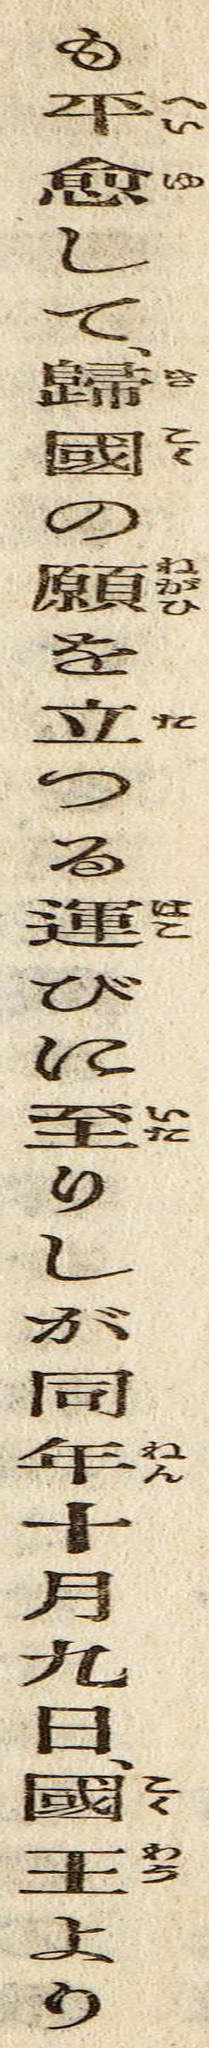も平愈して、帰国の願を立つる運びに至りしが同年十月九日、国王より
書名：日本漂流譚
